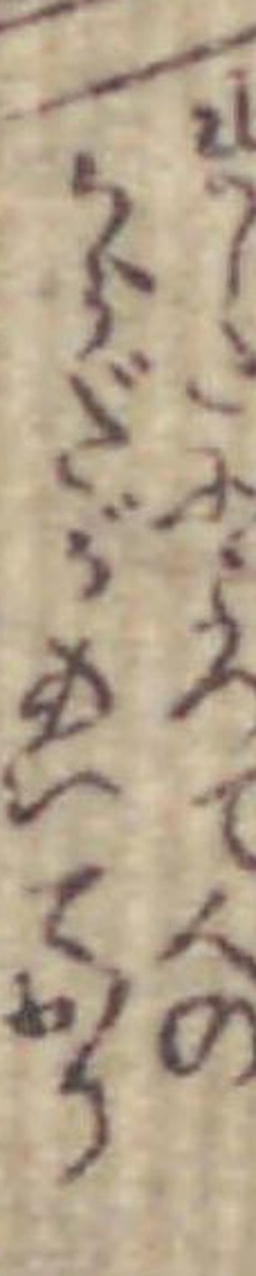からだがついており
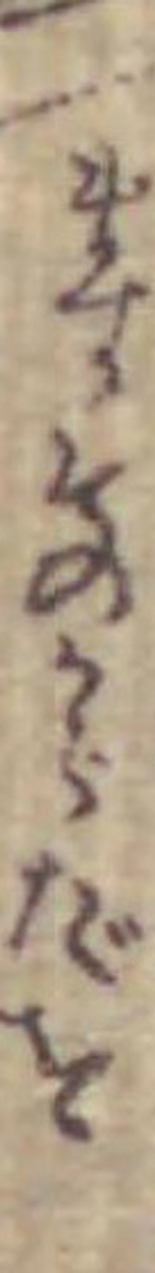ますそのからだを
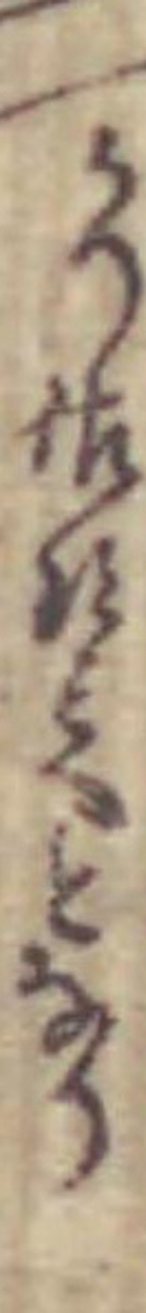かりさ治兵へとなり
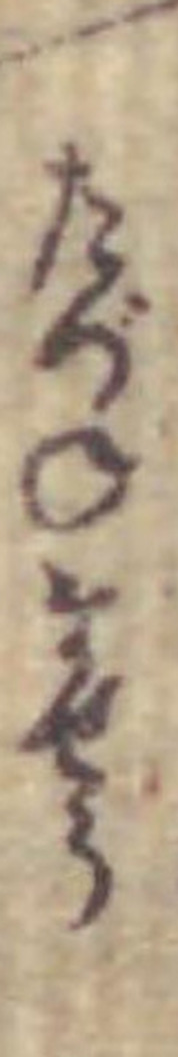たづねませう
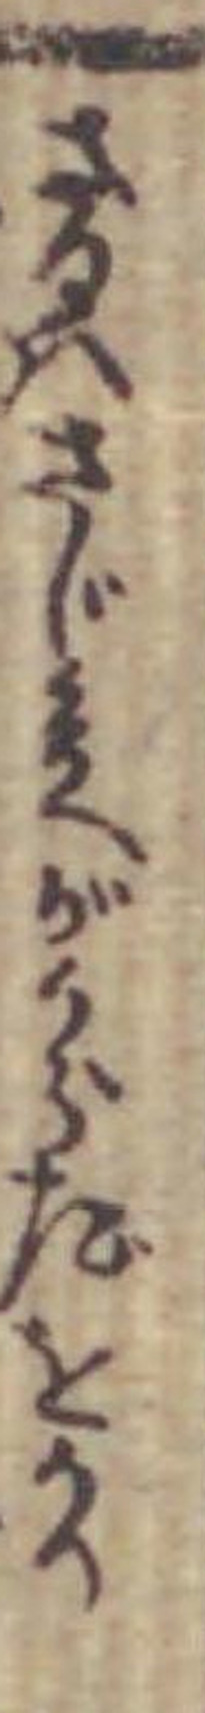さるはさじ兵へがからだをかり
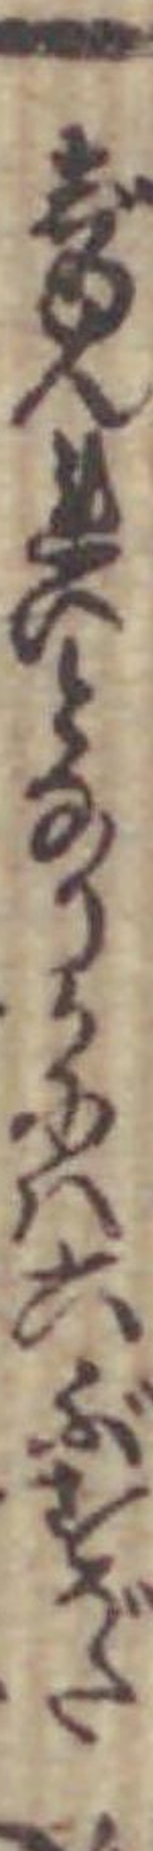じゆんれいとなりかには六ぶすがた
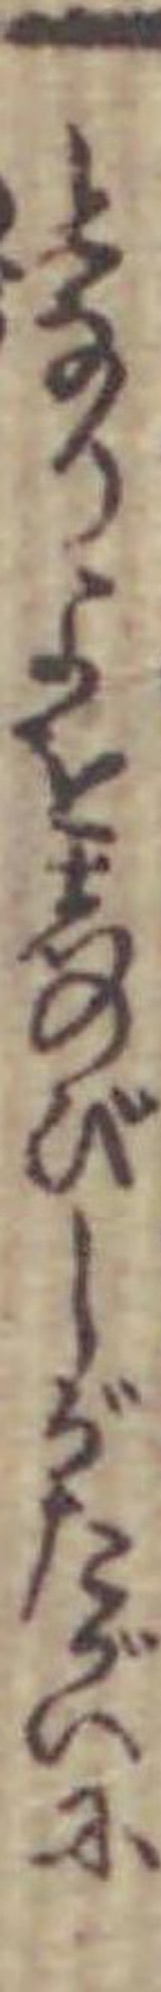となりよをしのびしがたがいに
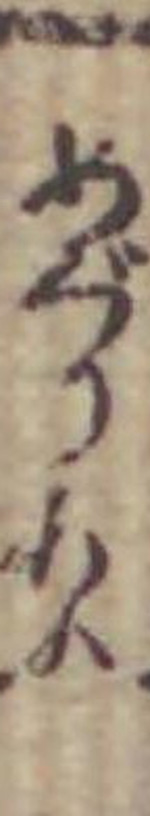めぐりあふ
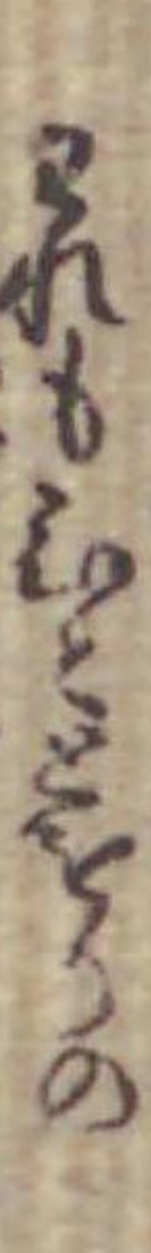われもひととをりの
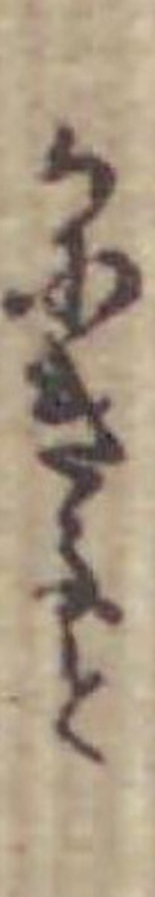かにきよと
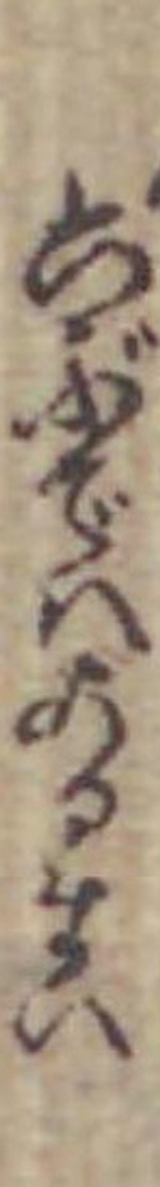六ぶではあるまい
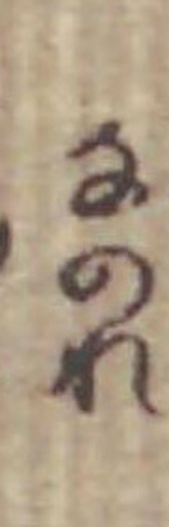なのれ
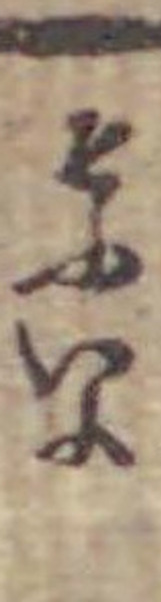そふいふ
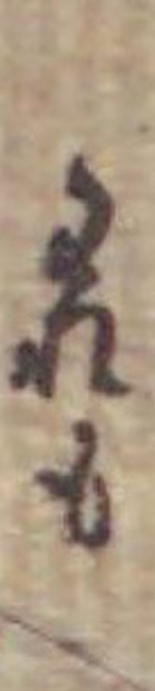われも
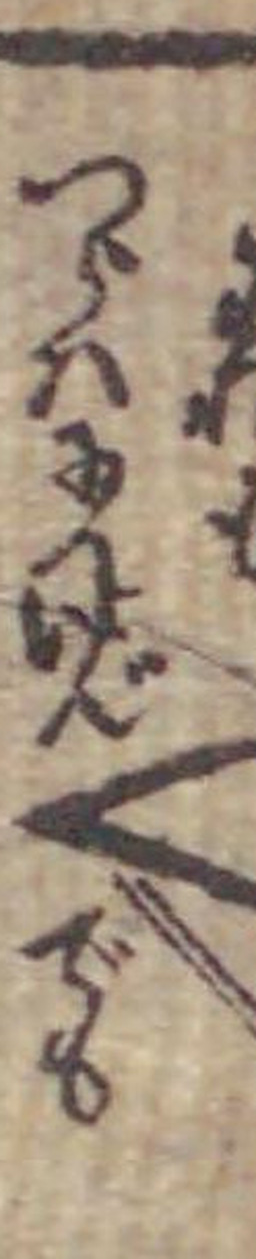つらはにんげんでも
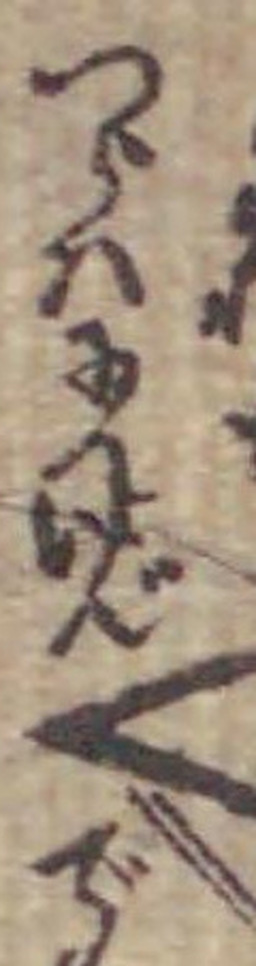つらはにんげんでも
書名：交古勢昔咄 : 2巻
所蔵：国立国会図書館 National Diet Library, JAPAN
